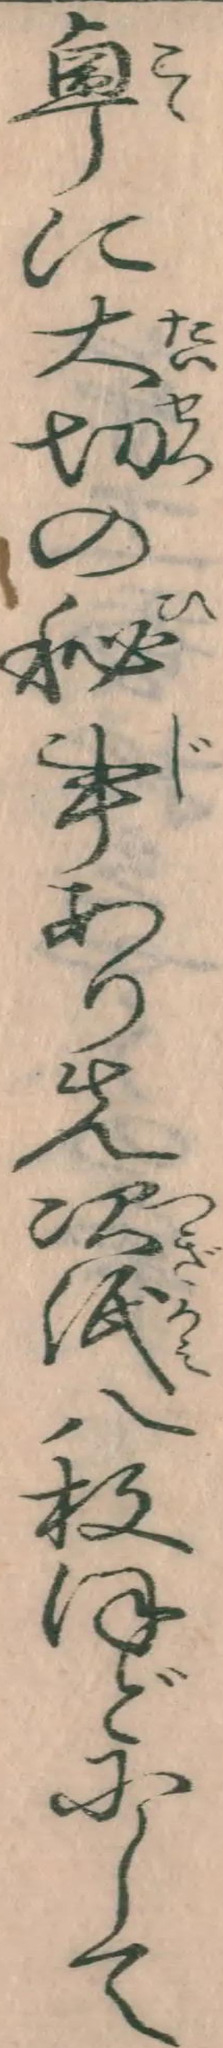粤に大切の秘事あり先次紙八枚ほどにして
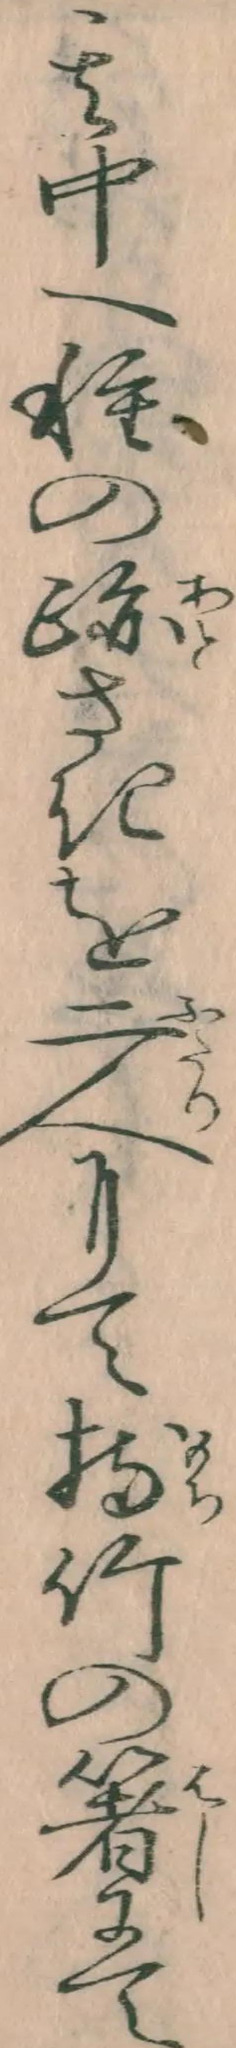其中へ種の跡さきを二人にて持竹の箸にて
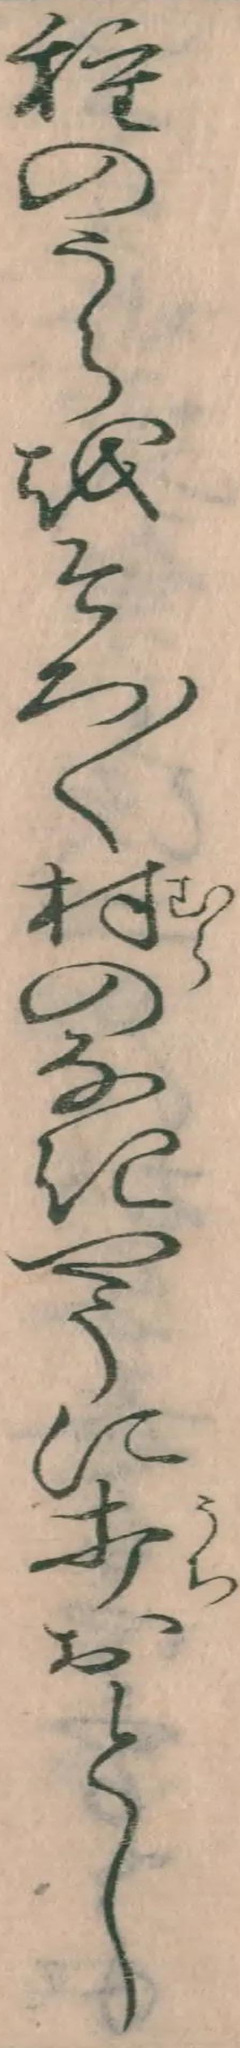種のうらをそろ〳〵村のなきやうに打おとし
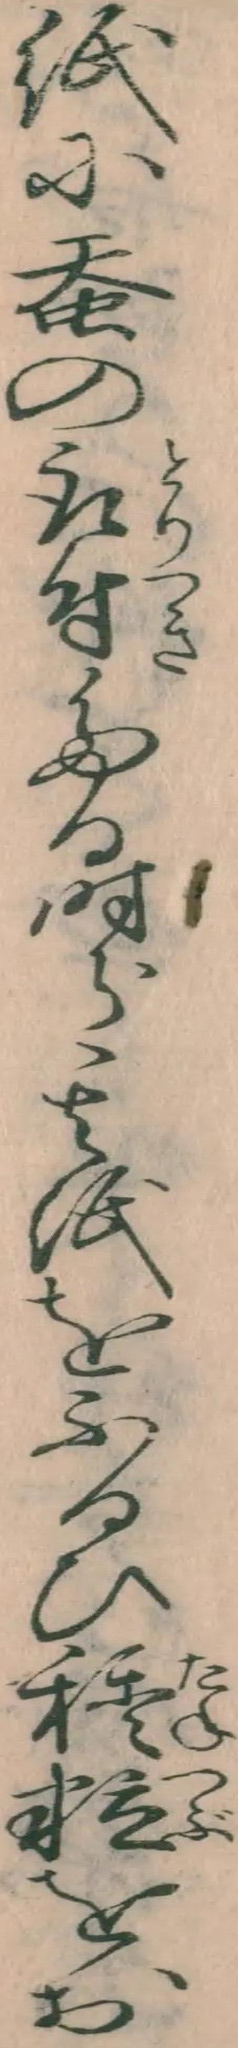紙に蚕の取付たる時分其紙をふるひ種粒をお
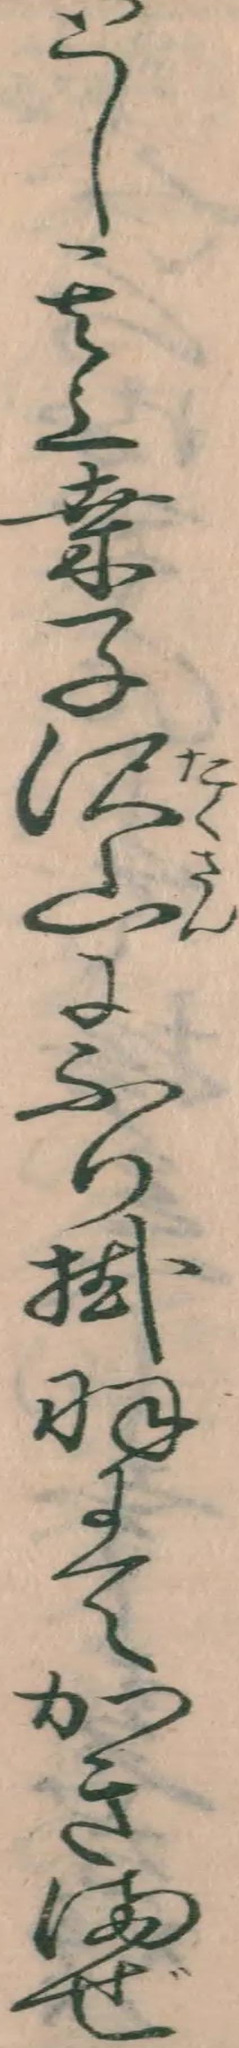とし其上桑子沢山にふり掛羽にてかきまぜ
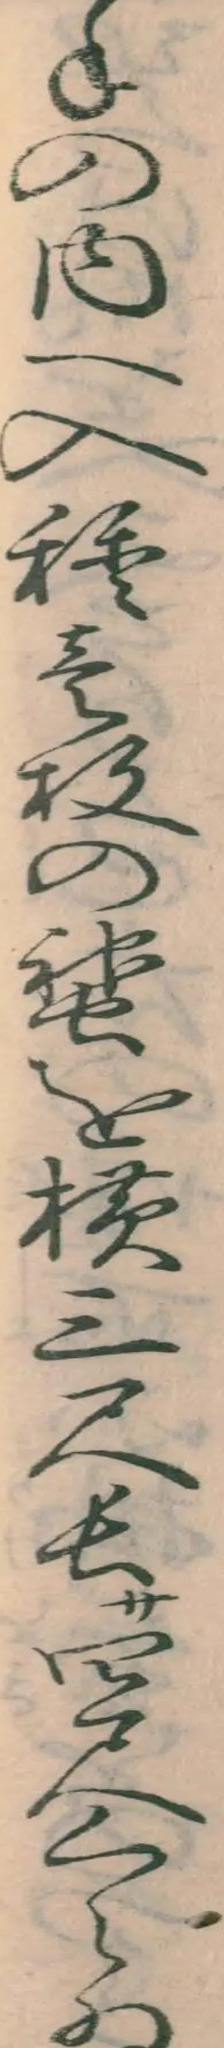手の内へ入種壱枚の䗝を横三尺長さ四尺くらゐ
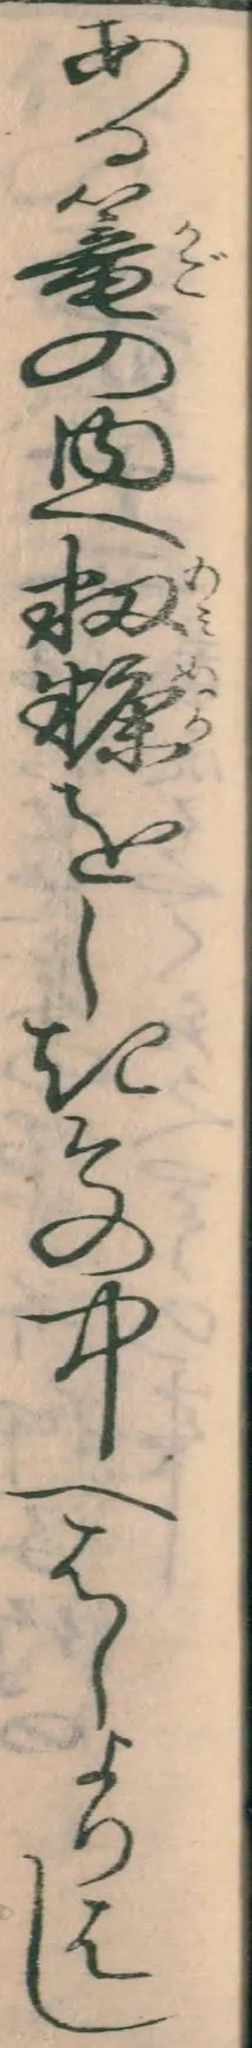ある篭の内へ籾糠をしきその中へはしよりはし
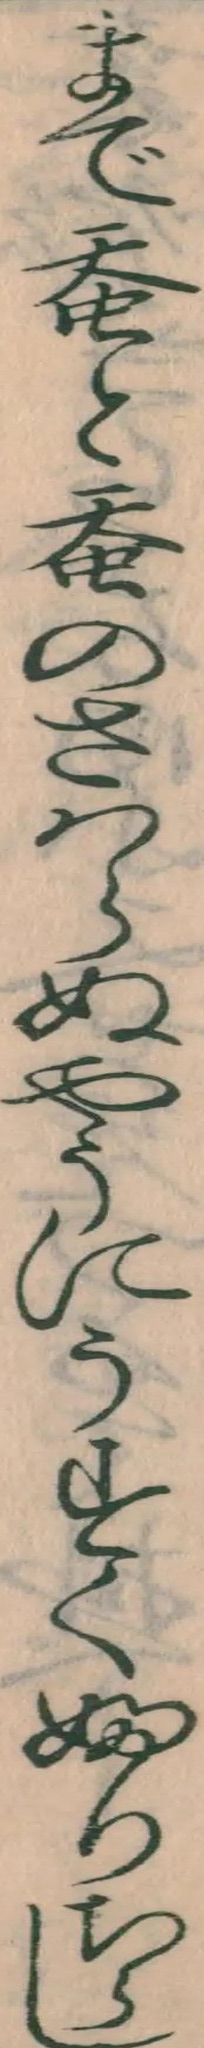まで蚕と蚕のさはらぬやうにうすくふりちらし
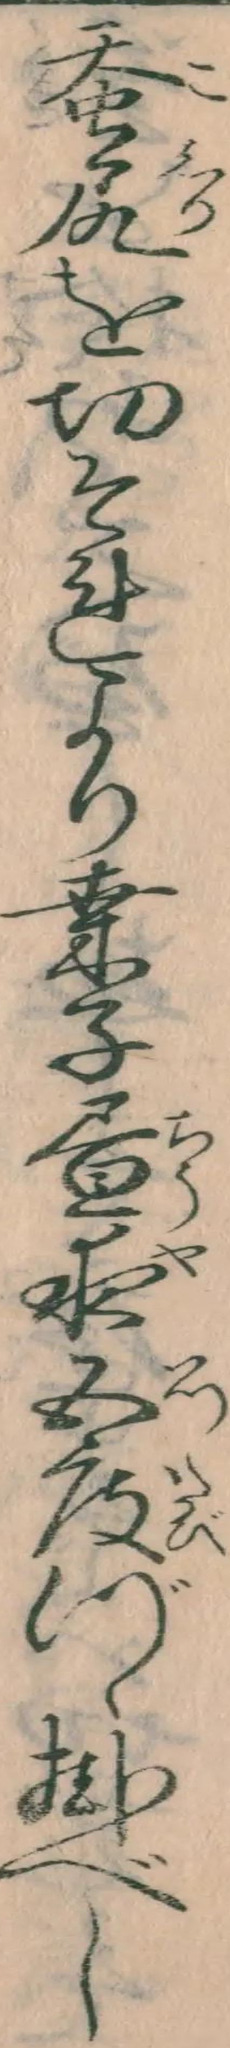蚕尻を切それより桑子昼夜五度づゝ掛べし
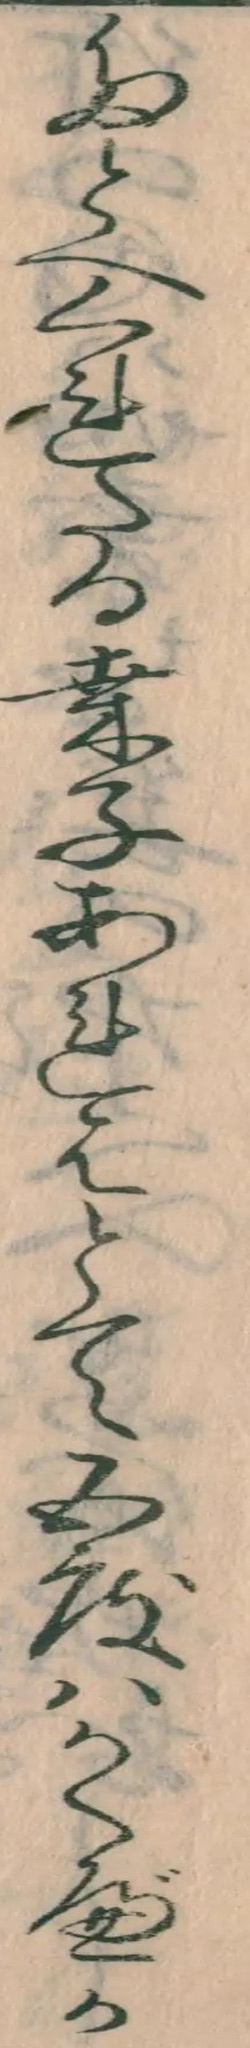たとへくれたる桑子あれはとて五度はかくべか
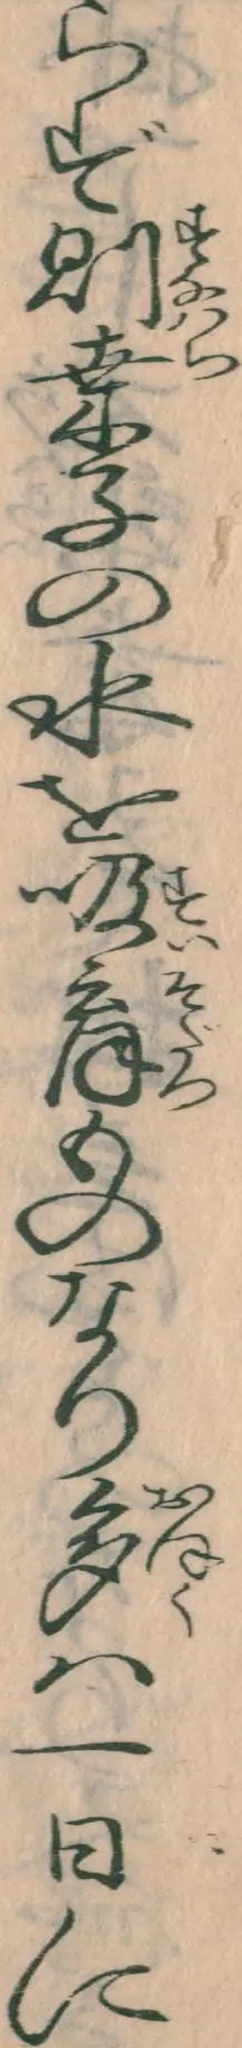らず則桑子の水を吸育ものなり多は一日に
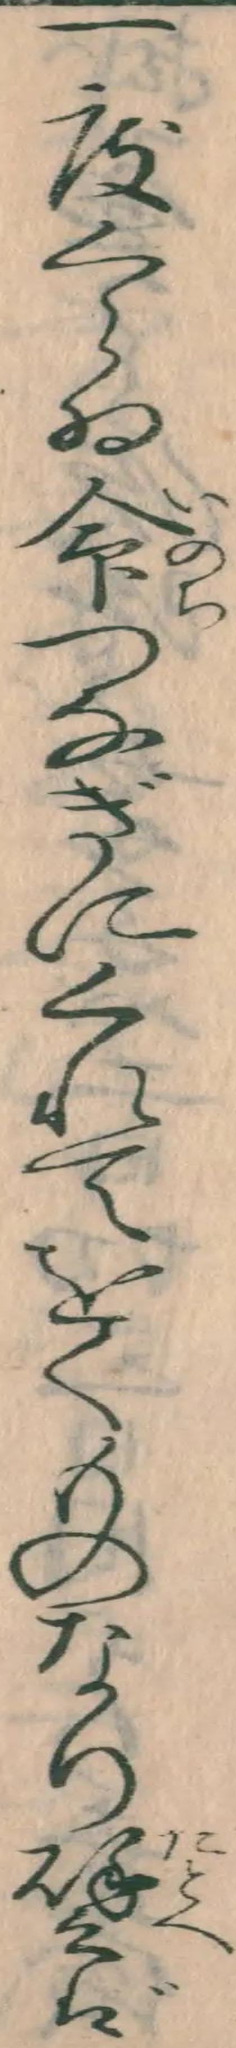一度くらゐ命つなぎにくれてをくものなり譬ば
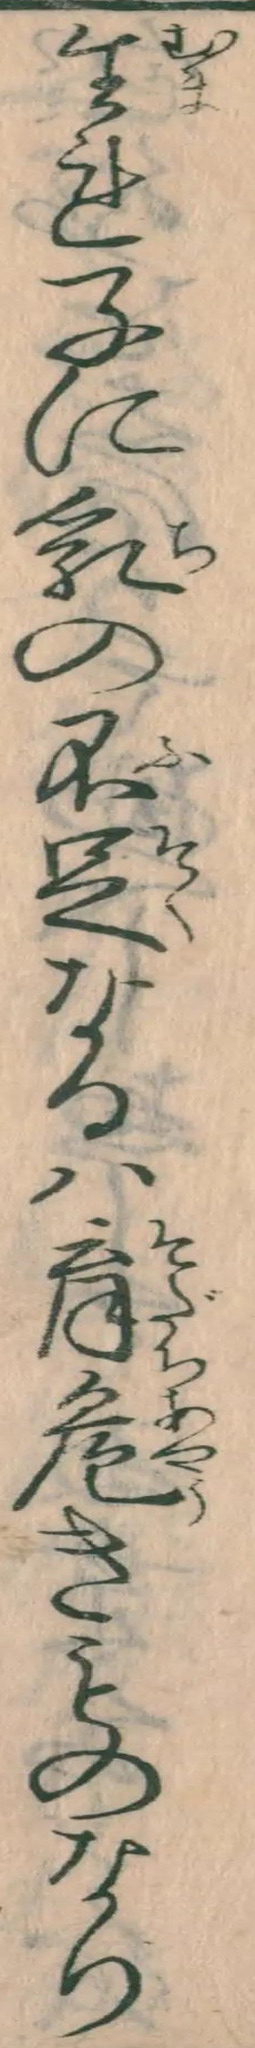生れ子に乳の不足なるは育危きものなり
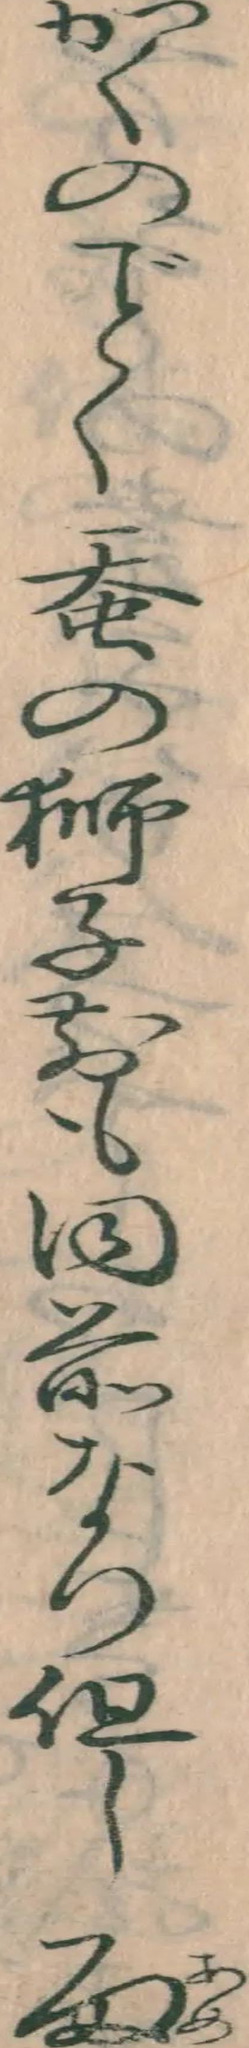かくのごとく蚕の獅子前も同前なり但し雨

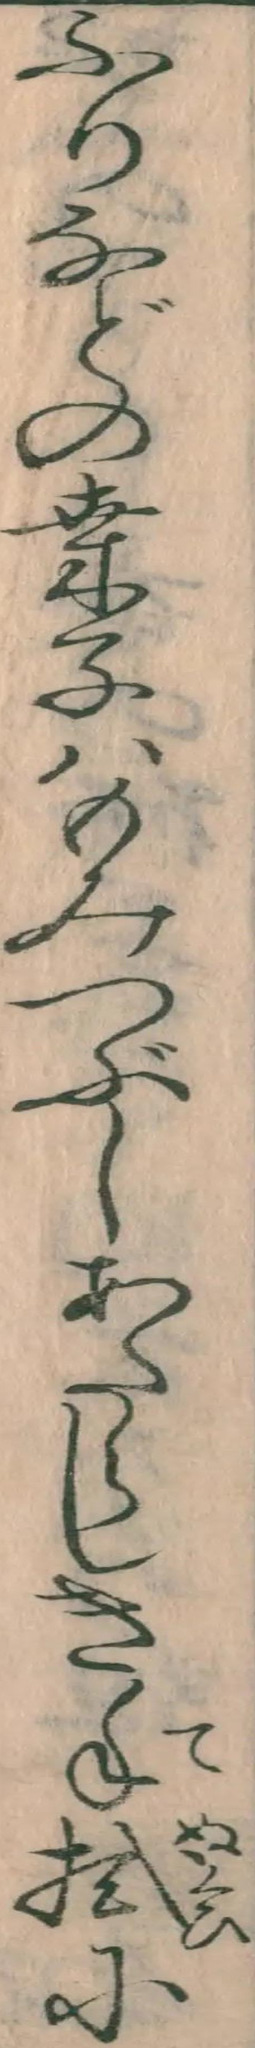ふりなどの桑子はもみつぶしあたあたらしき手拭に
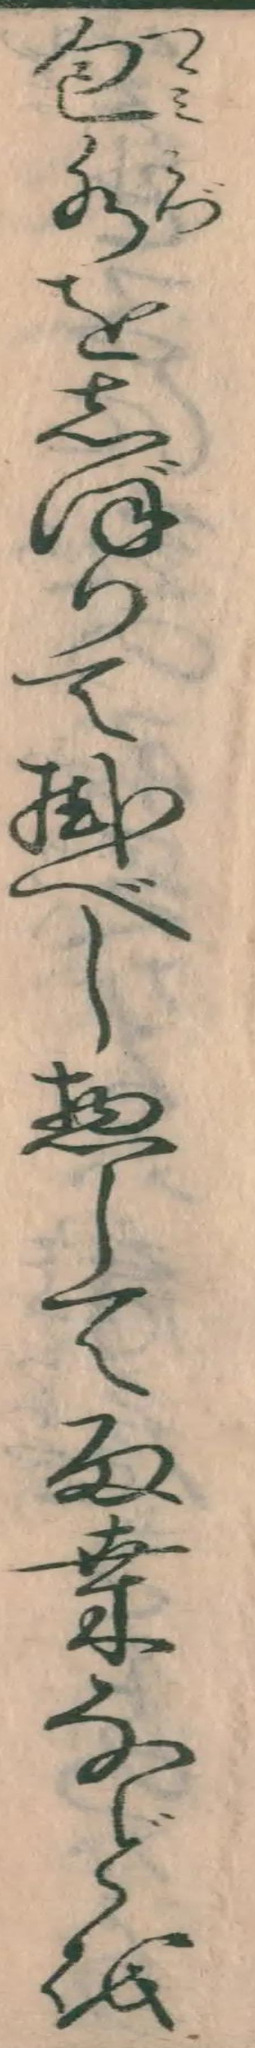包水をしぼりて掛べし惣して雨桑などを
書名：新撰養蚕秘書
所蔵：国立国会図書館 National Diet Library, JAPAN
